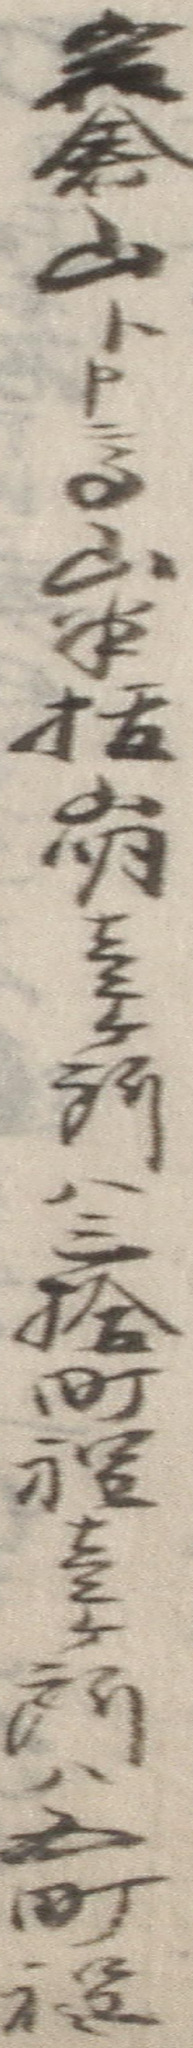岩倉山ト申高山半抜崩壱ヶ所ハ三拾町程壱ヶ所ハ五町程之
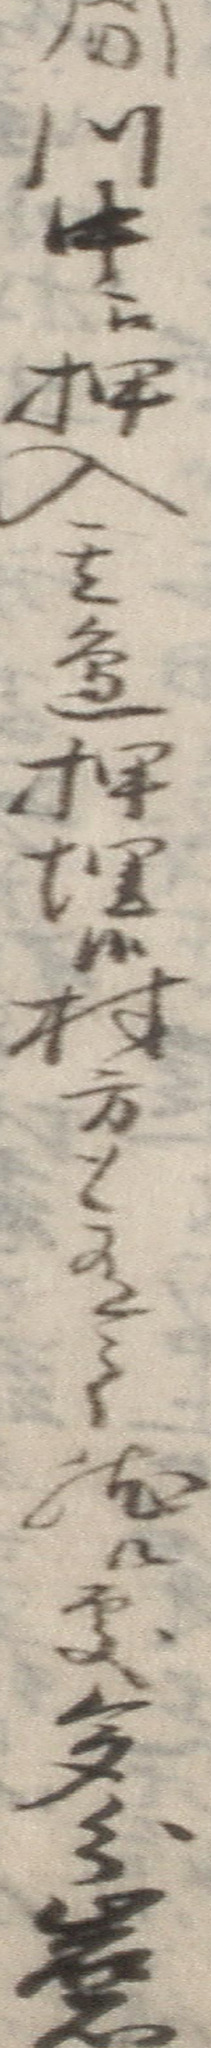間川中江押入其辺押埋候村方も有之然ル処多分岩石
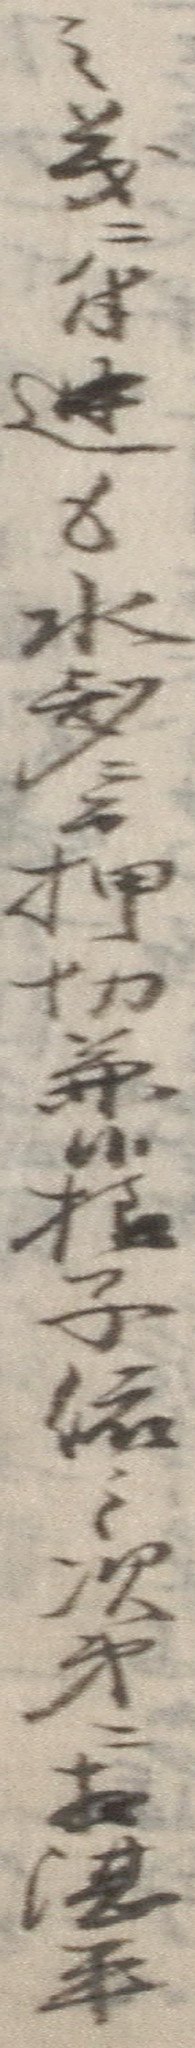之義ニ付迚も水声ニ而押切兼候様子依之次第ニ相湛平
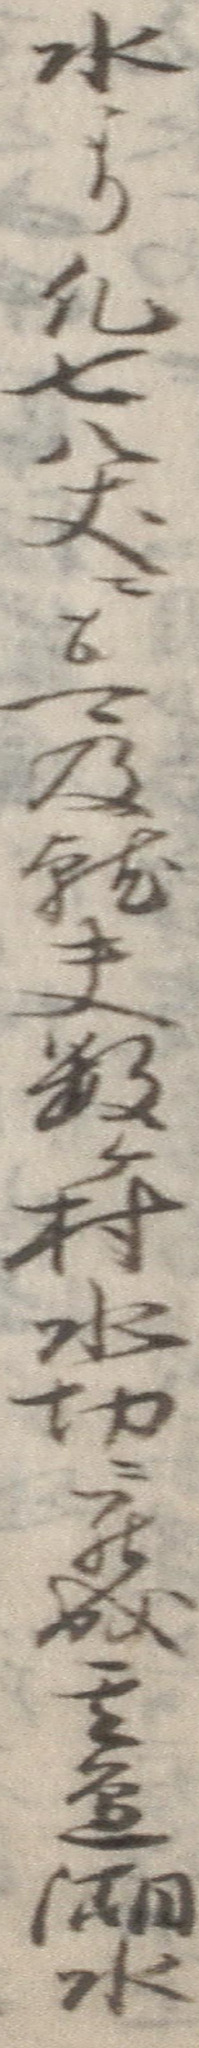水より凡七八丈ニも可及就夫数ヶ村水切ニ罷成其辺湖水
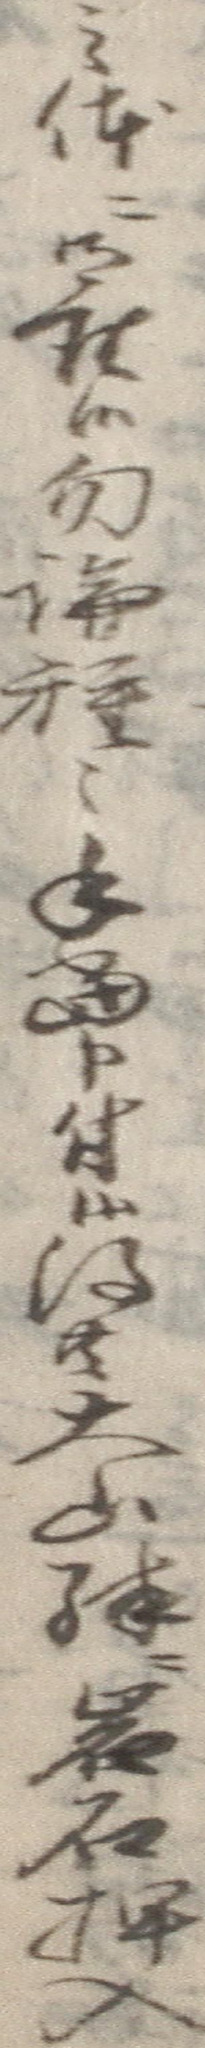之体ニ御座候勿論種々手当申付候得共大山殊ニ岩石押入
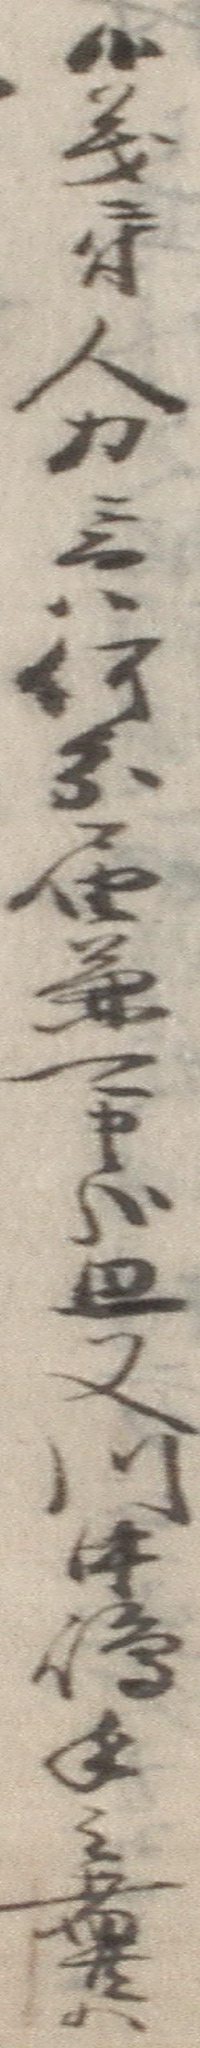候義ニ付人力ニ而ハ何分届兼可申哉且又川中嶋手之者共ハ
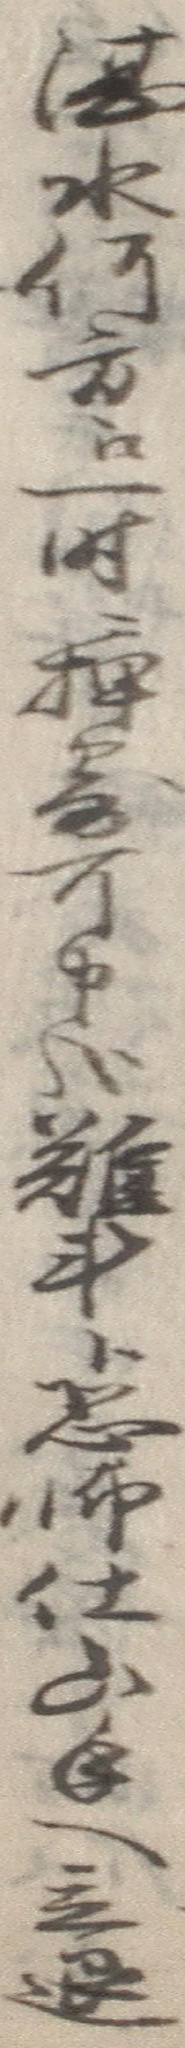湛水何方江一時ニ押寄可申哉難計ト恐怖仕山手へ立退
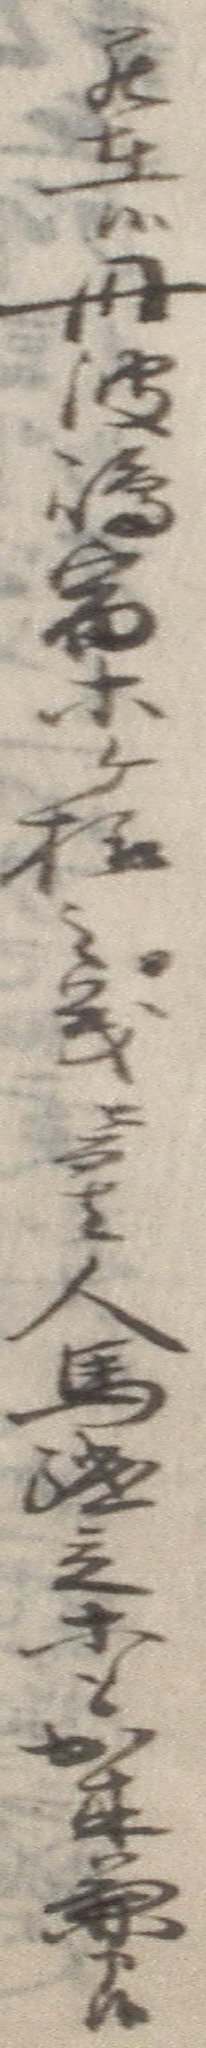罷在候丹波嶋宿等ヶ様之義ニ而者人馬継立等も出来兼申候
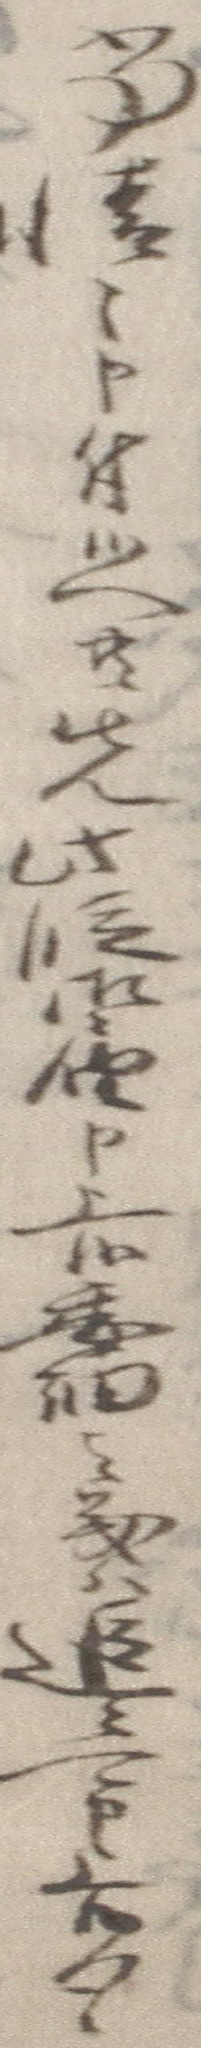尚情々申付候へ共先此段御届申上候委細之義ハ追々可申上候以上
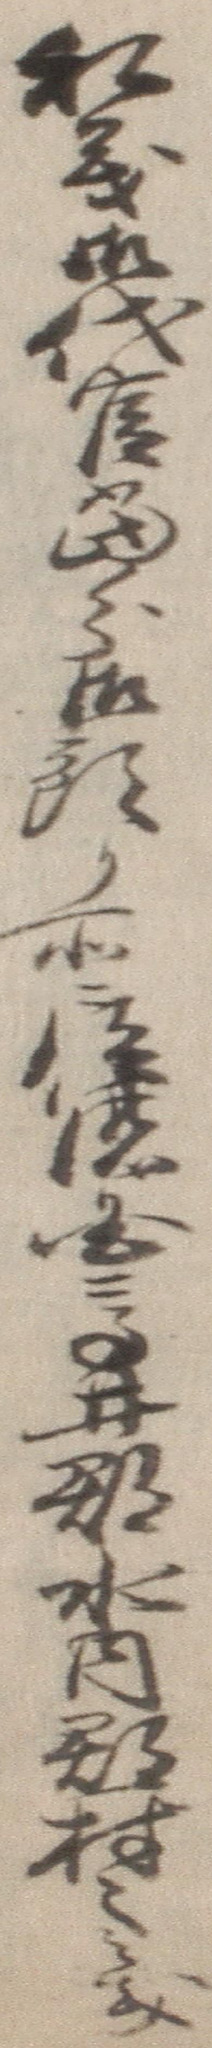私義御代官当分御預り所信濃国高井郡水内郡村々之義
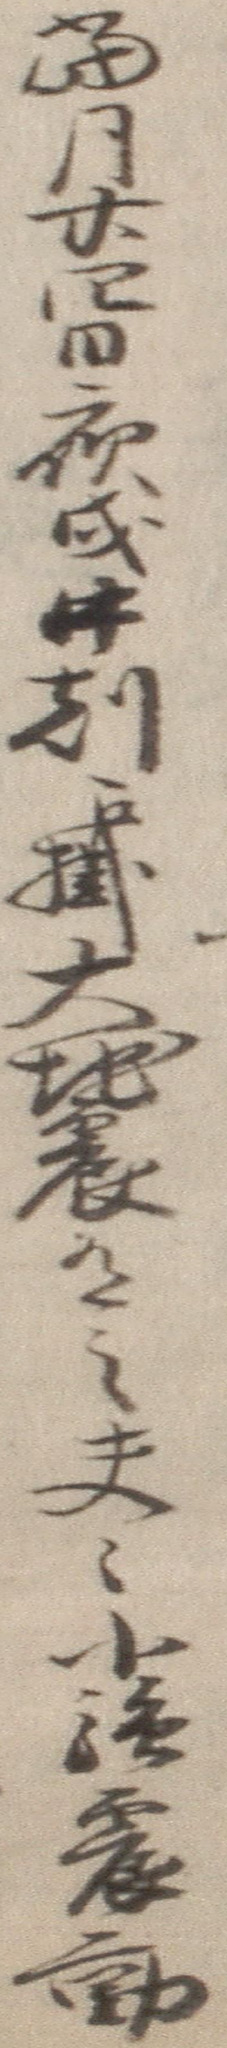当月廿四日夜戌中刻江掛大地震有之夫々小強震動
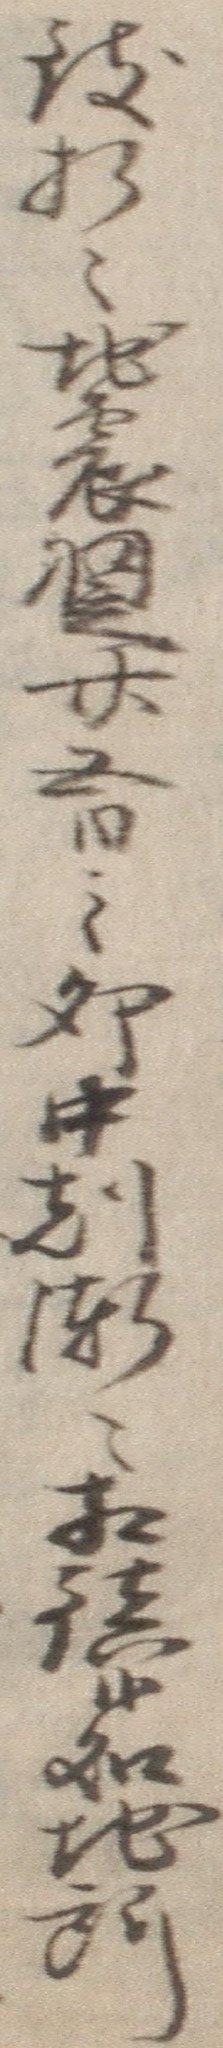致折々地震翌廿五日之卯中刻漸々相鎮候処地所
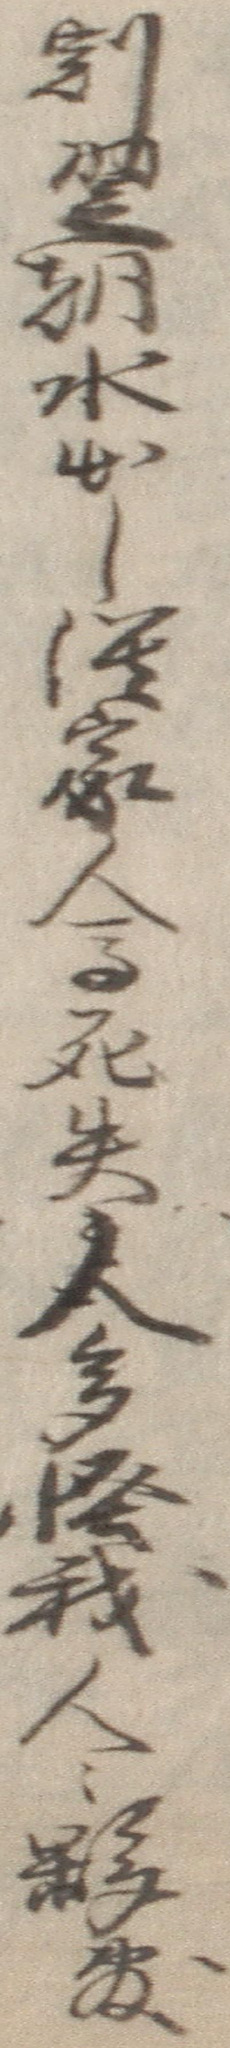割翌朝水出し潰家人馬死失人多怪我人之夥敷
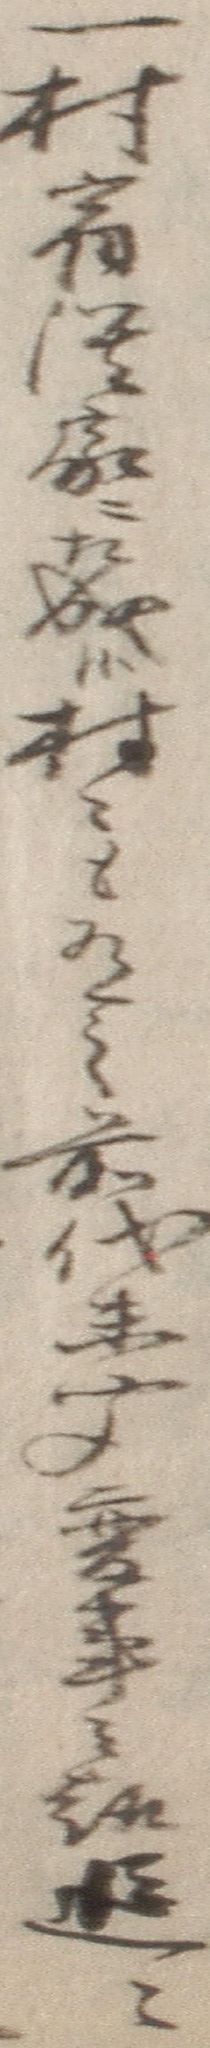一村宿潰家ニ相成候村々も有之前代未聞変事之趣追々
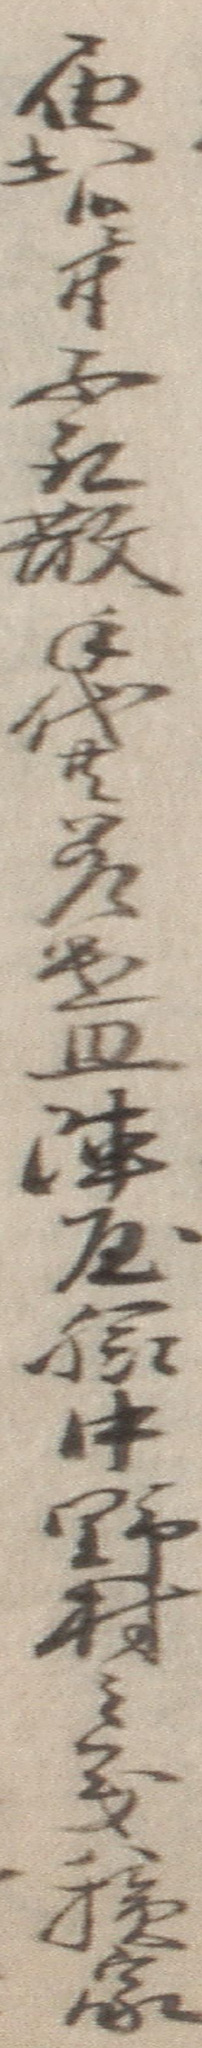届出候ニ付不取敢手代共差遣且陣屋脇中野村之義ハ損家
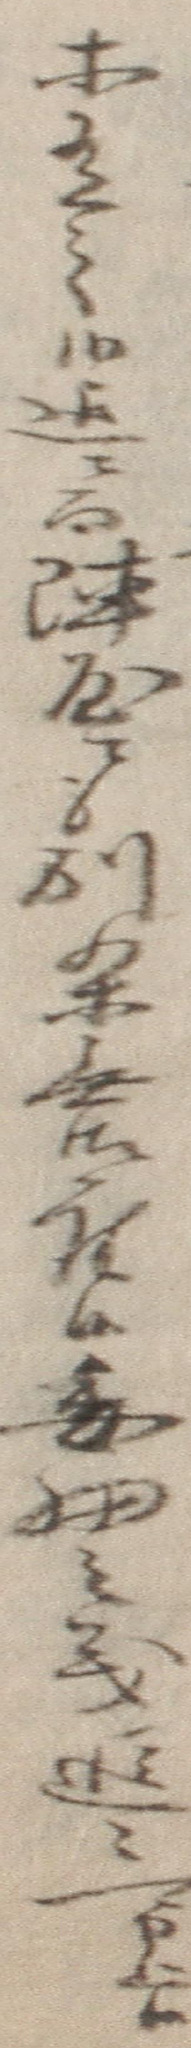等有之候迄ニ而陣屋ニも別条無御座候委細之義追々可申上候
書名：[善光寺地震に関する冊子]
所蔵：東京大学地震研究所図書室 Earthquake Research Institute Library, The University of Tokyo, JAPAN
